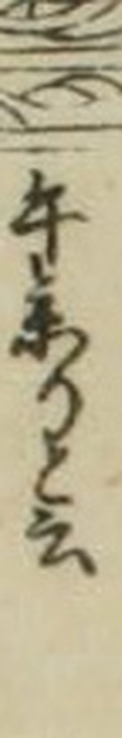午参りと云
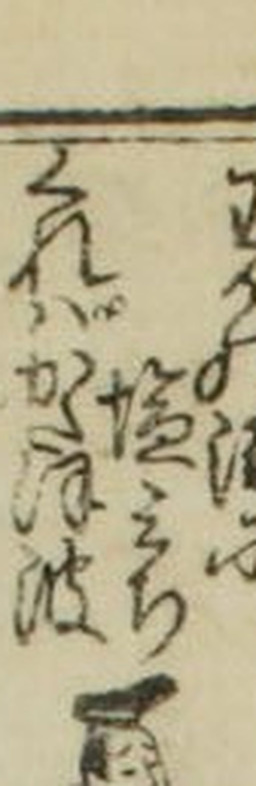くればかたほ波
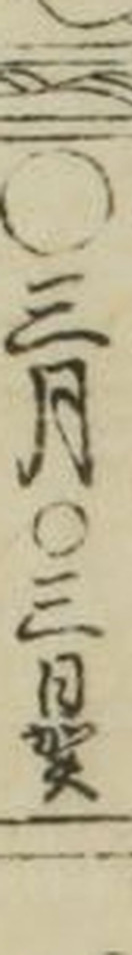○三月○三日賀
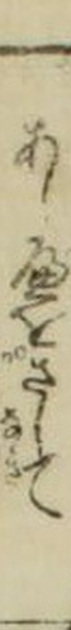あしべをさして
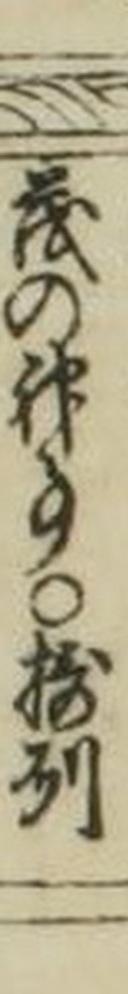茂の神事○攝州
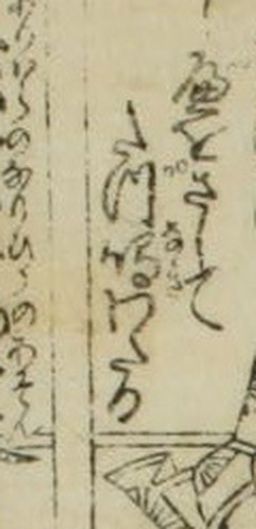たづ鳴わたる
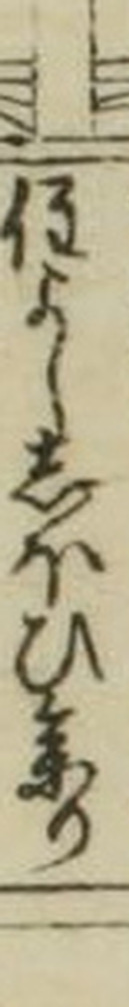住よししほひ参り
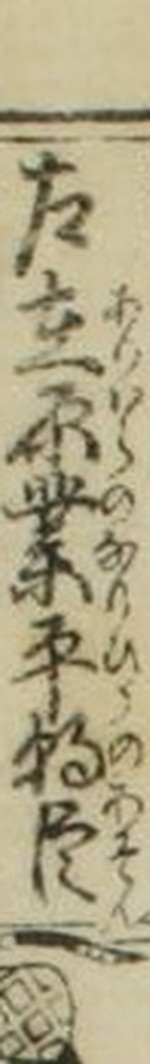左在原業平朝臣
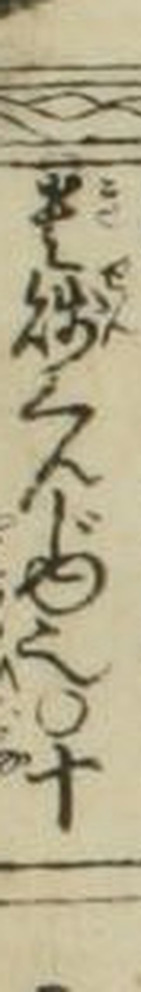貴賤くんじゅ也○十
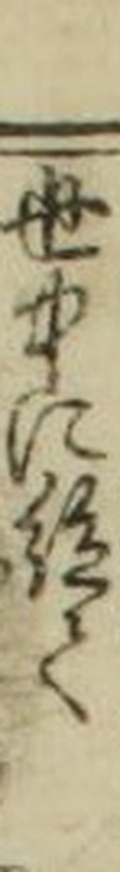世中に絶て
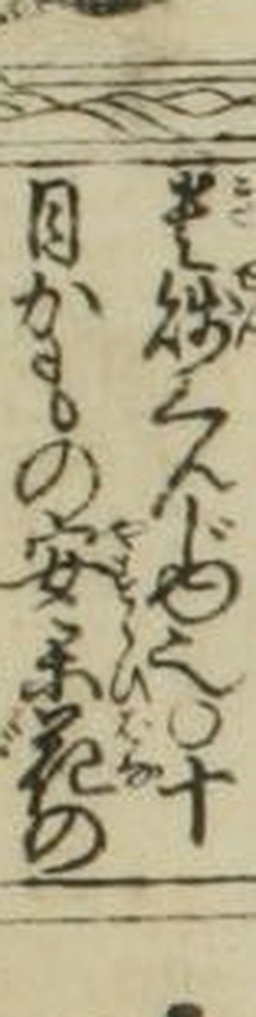日かもの安楽花の
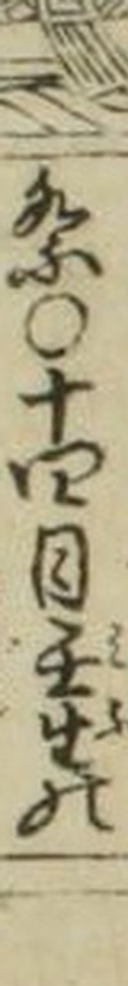祭○十四日壬生の
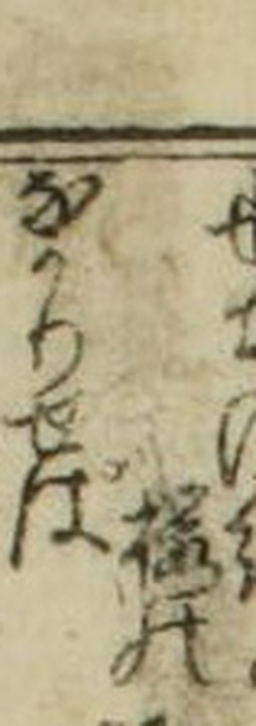なかりせば
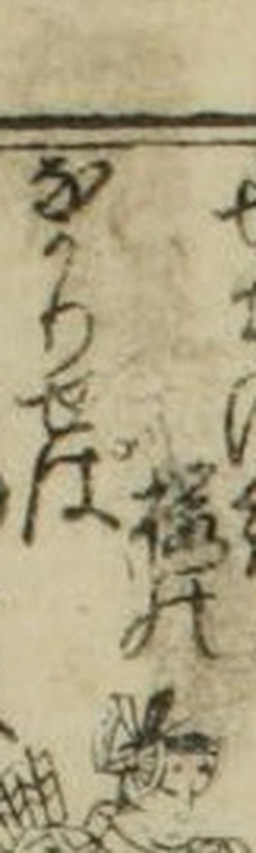なかりせば
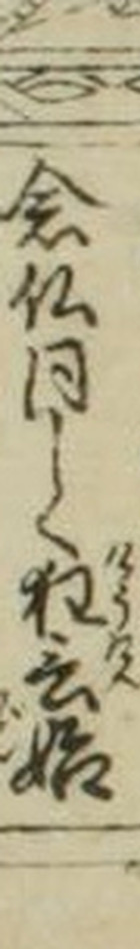念仏同しく狂言始
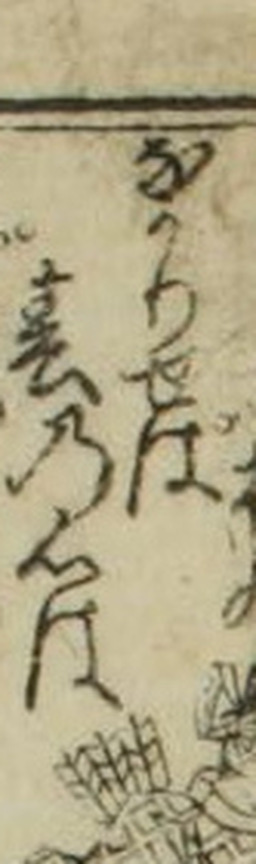春の心は
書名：女源氏教訓鑑
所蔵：東京学芸大学附属図書館
